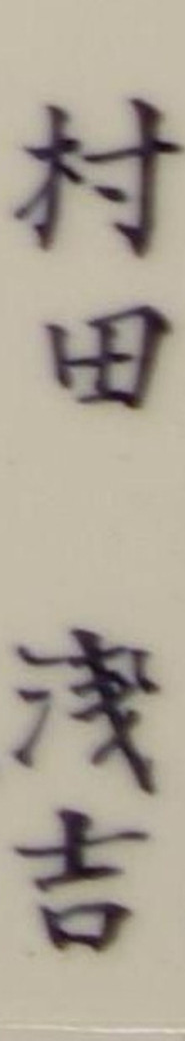村田浅吉
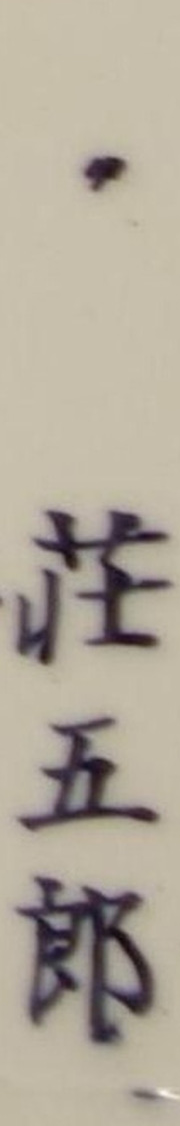荘五郎
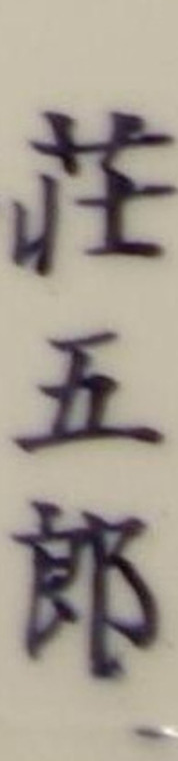荘五郎
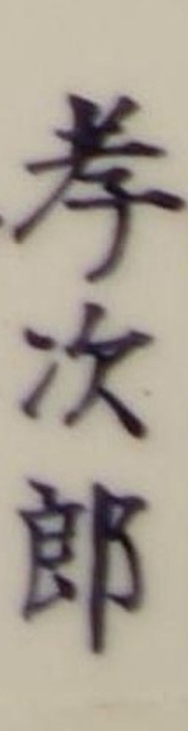考次郎
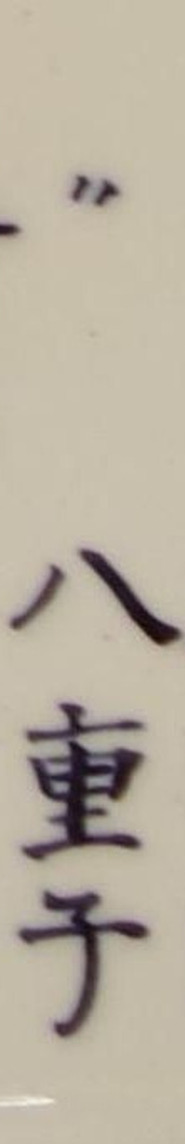八重子
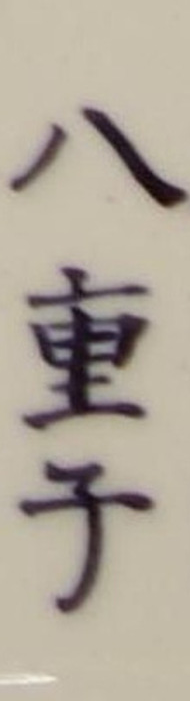八重子
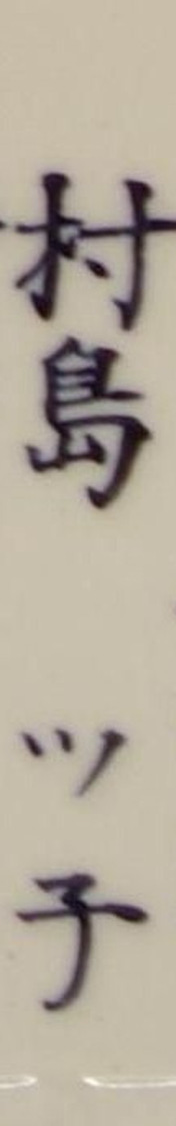村島ツ子
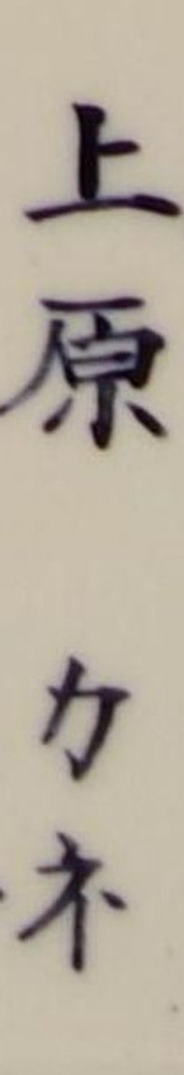上原カネ
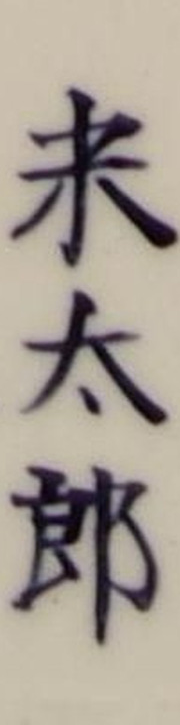米太郎
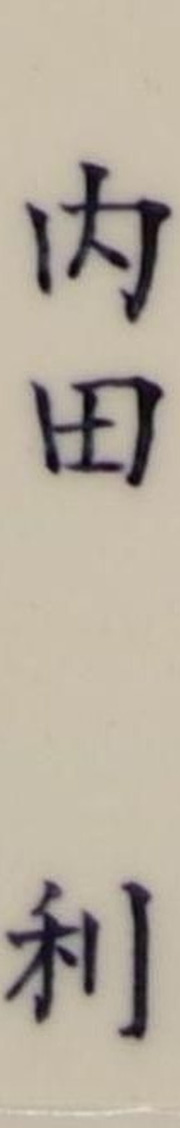内田利
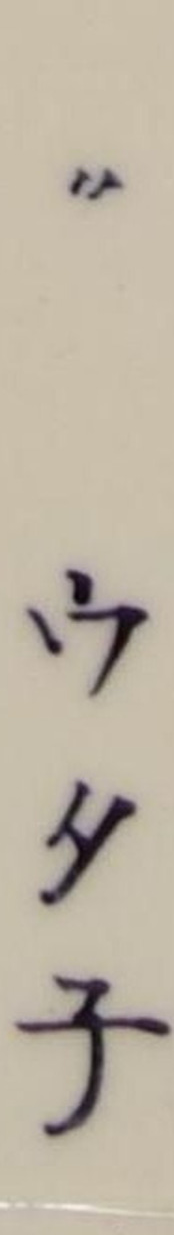ウタ子
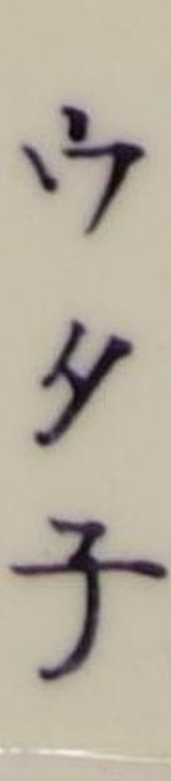ウタ子
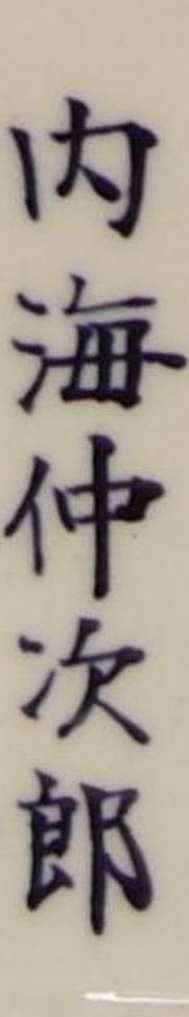内海仲次郎
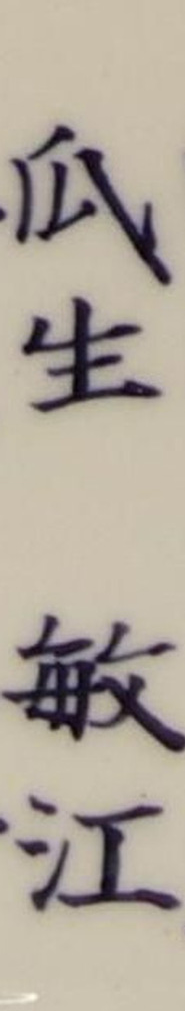瓜生敏江
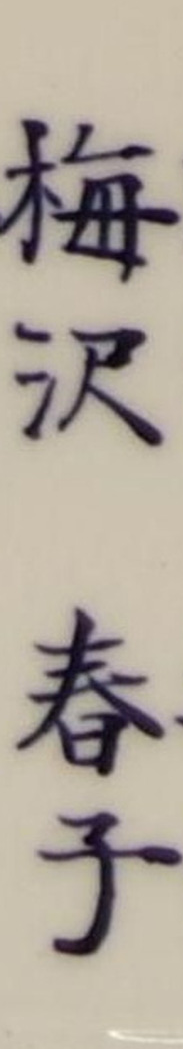梅沢春子
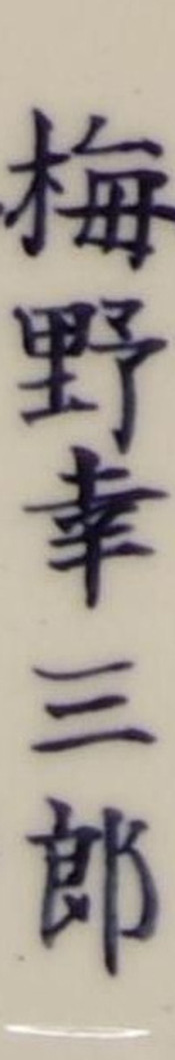梅野幸三郎
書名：M~S
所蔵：高野山金剛峯寺
